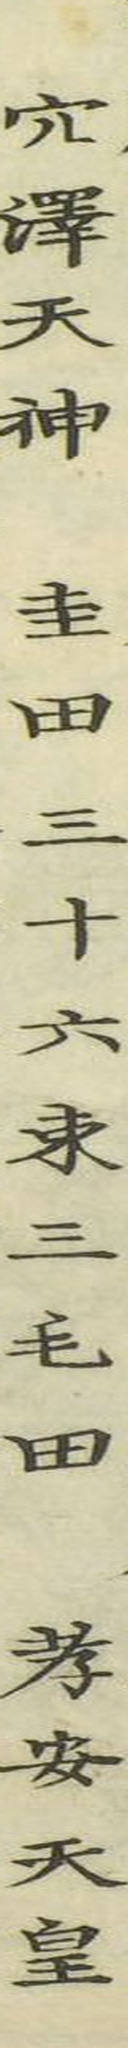穴沢天神圭田三十六束三毛田考安天皇
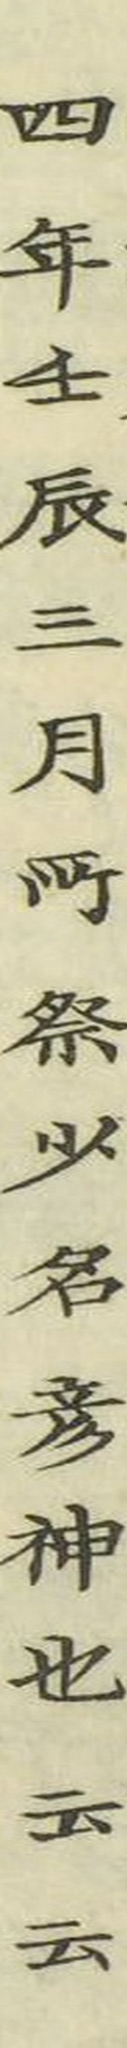四年壬辰三月所祭少名彦神也云々
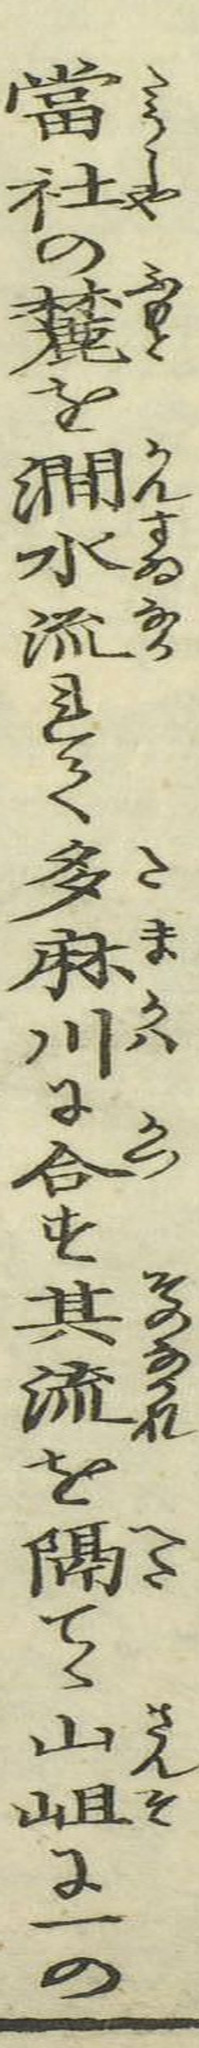当社の麓を澗水流れて多麻川に合す其流を隔てゝ山岨に一の
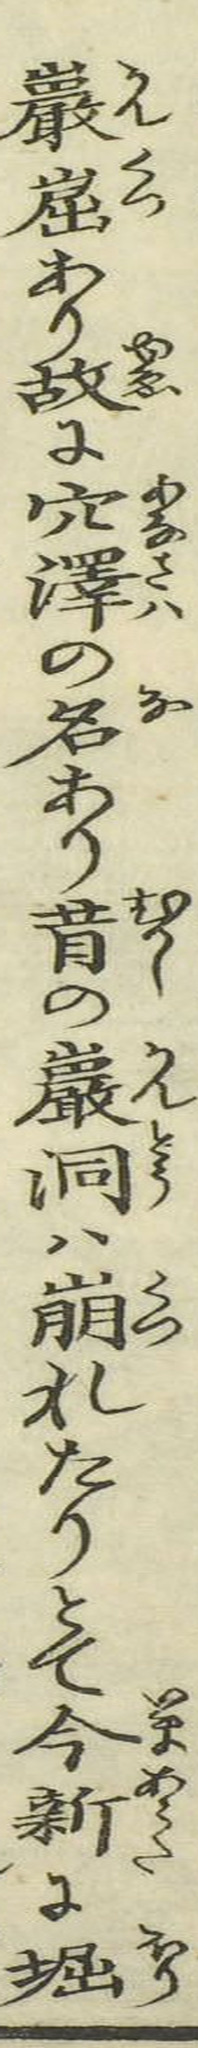巌崫あり故に穴沢の名あり昔の巌洞は崩れたりとて今新に掘
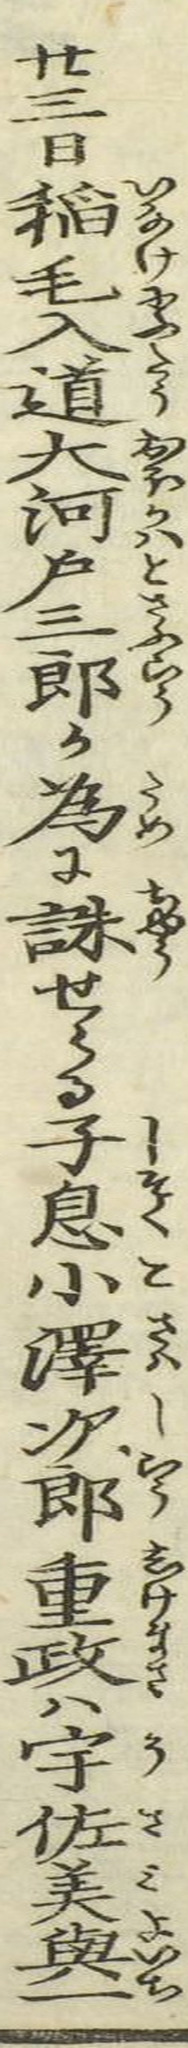廿三日稲毛入道大河戸三郎か為に誅せらる子息小沢次郎重政は宇佐美与一
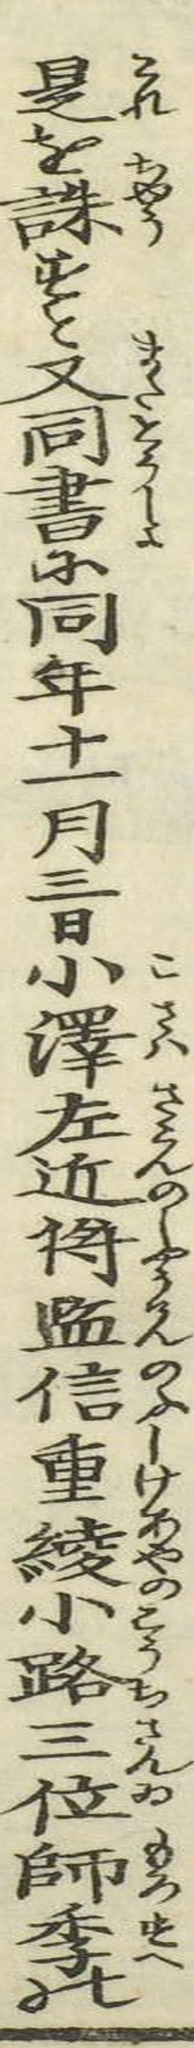是を誅すと又同書に同年十一月三日小沢左近将監信重綾小路三位師季の
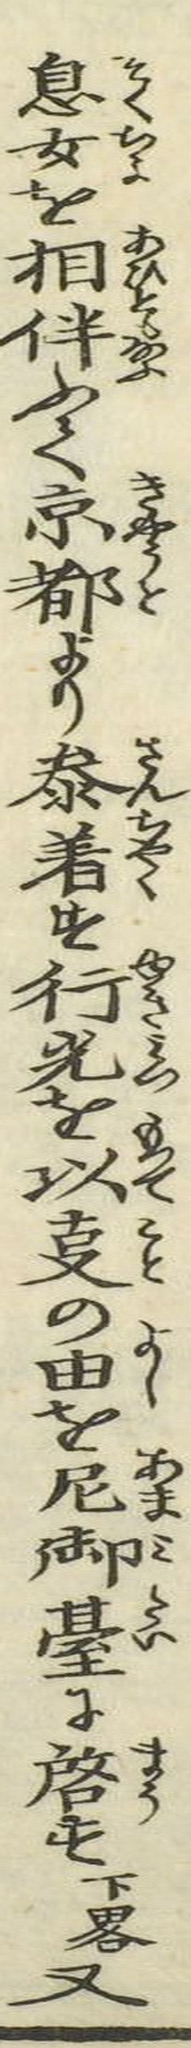息女を相伴ふて京都より参着す行光を以事の由を尼御台に啓す下略又
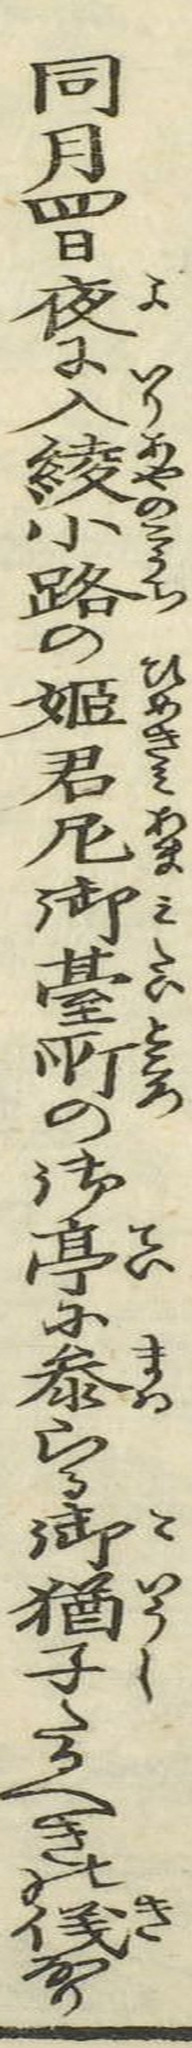同月四日夜に入綾小路の姫君尼御台所の御亭に参らる御猶子たるへきの儀なり
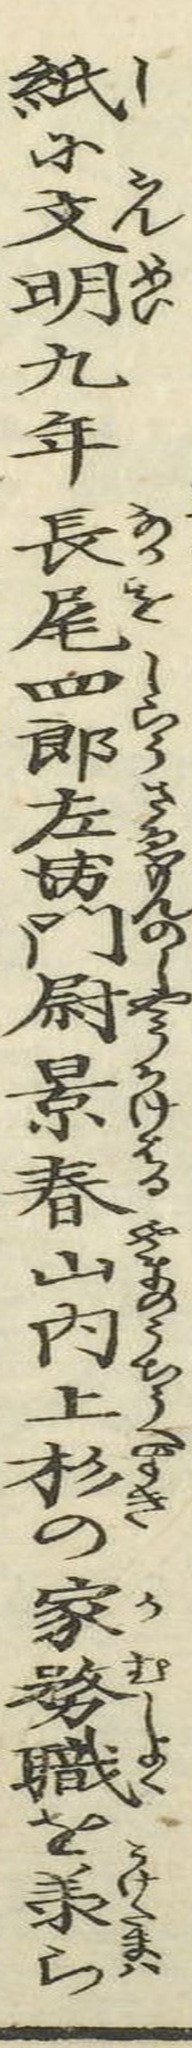紙に文明九年長尾四郎左衛門尉景春山内上杉の家務職を承ら
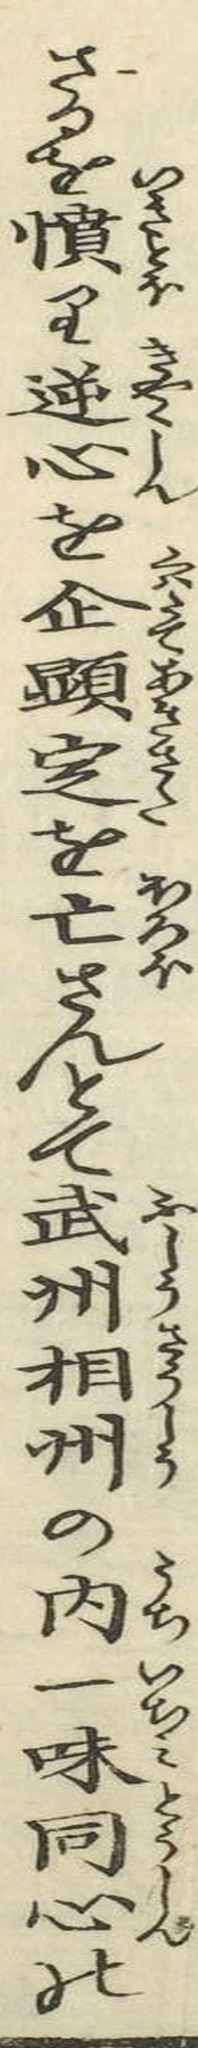さるを憤り逆心を企顕定を亡さんとて武州相州の内一味同心の
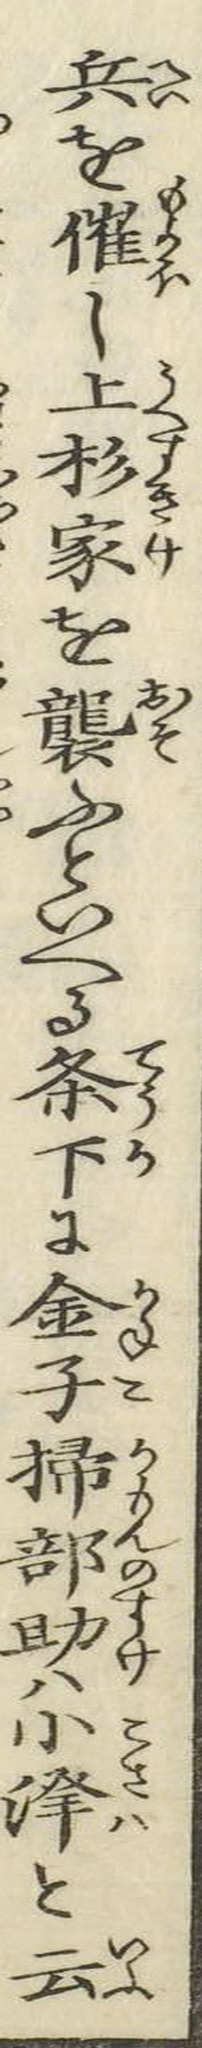兵を催し上杉家を襲ふといへる条下に金子掃部助は小沢と云
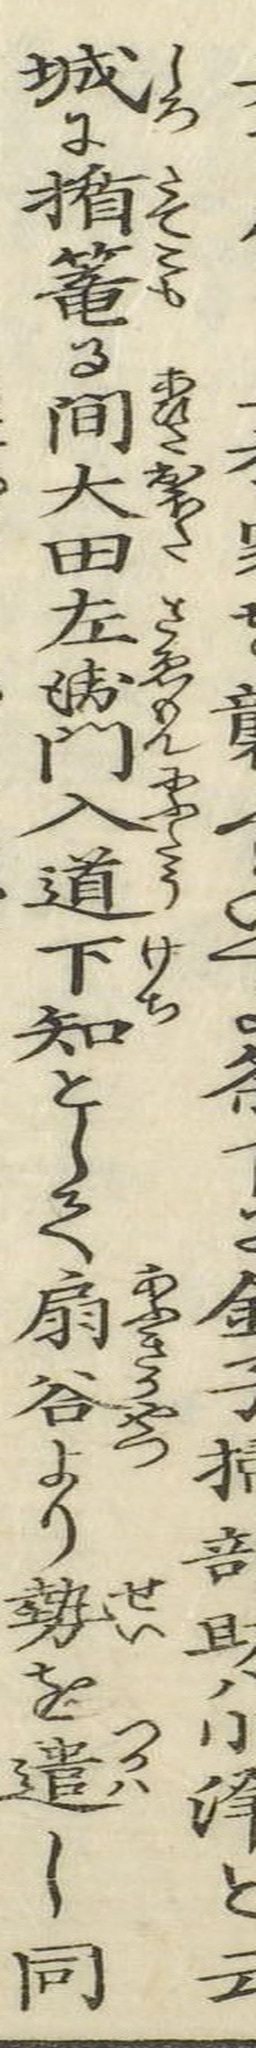城に楯籠る間太田左衛門入道下知として扇谷より勢を遣し同
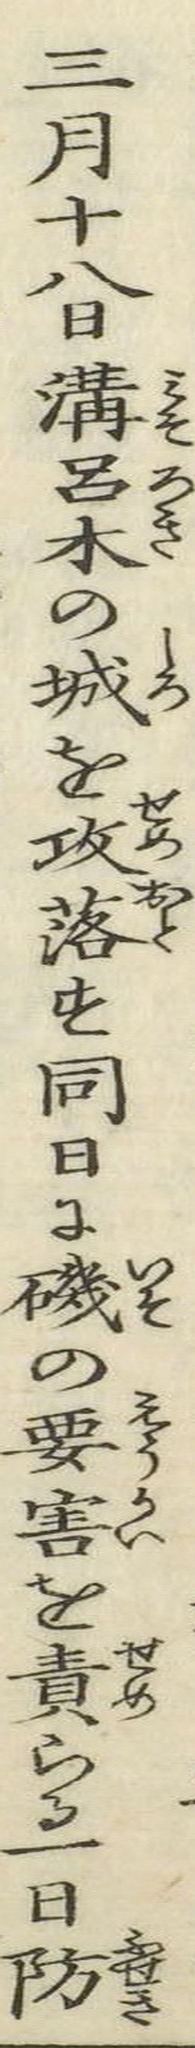三月十八日溝呂木の城を攻落す同日に磯の要害を責らる一日防
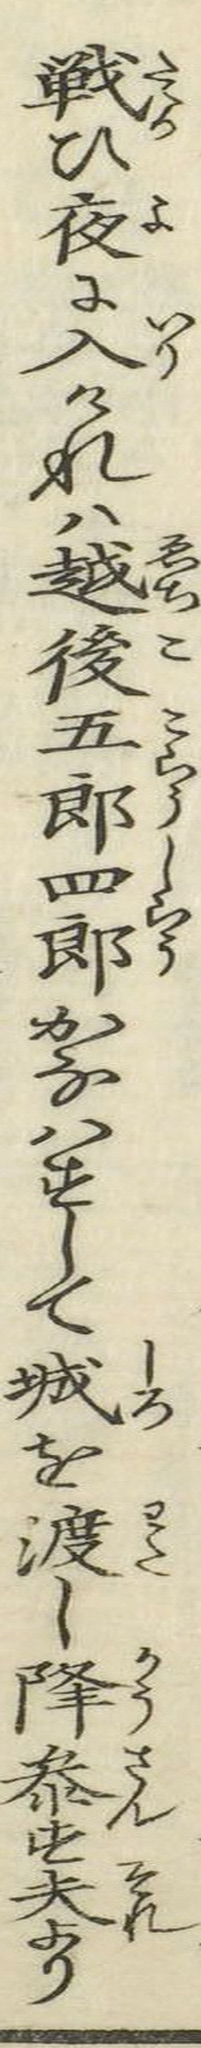戦ひ夜に入けれは越後五郎四郎かなはすして城を渡し降参す夫より
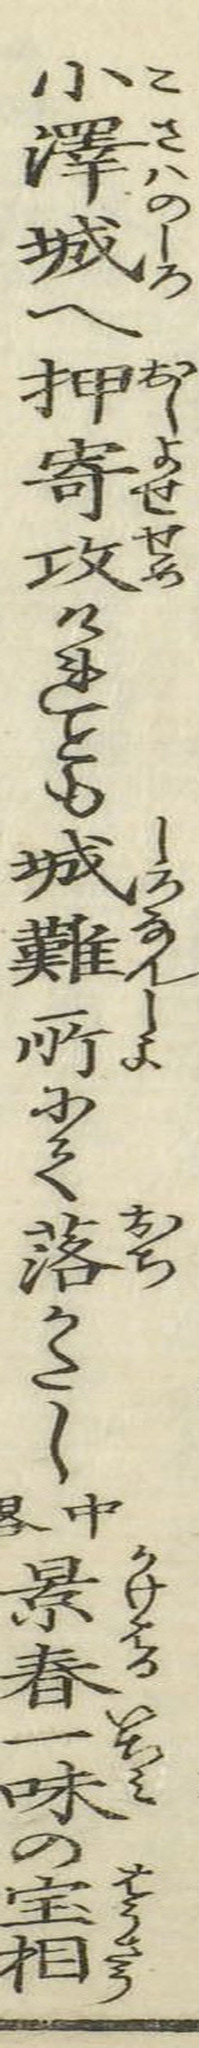小沢城へ押寄攻けれとも城難所にて落かたし中略景春一味の宝相
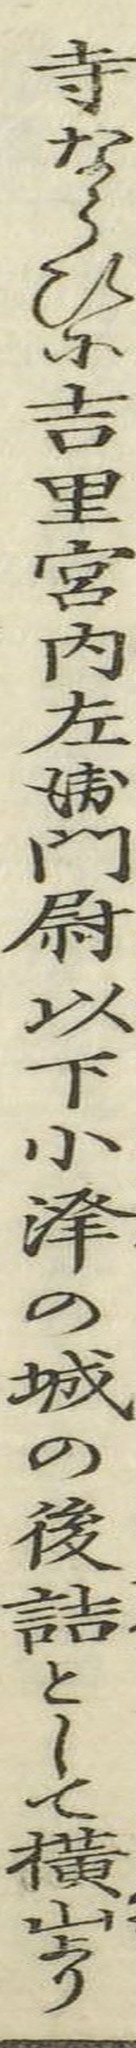寺ならひに吉里宮内左衛門尉以下小沢の城の後詰として横山より
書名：江戸名所図会 20巻 巻之10
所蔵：東京学芸大学教育コンテンツアーカイブ
